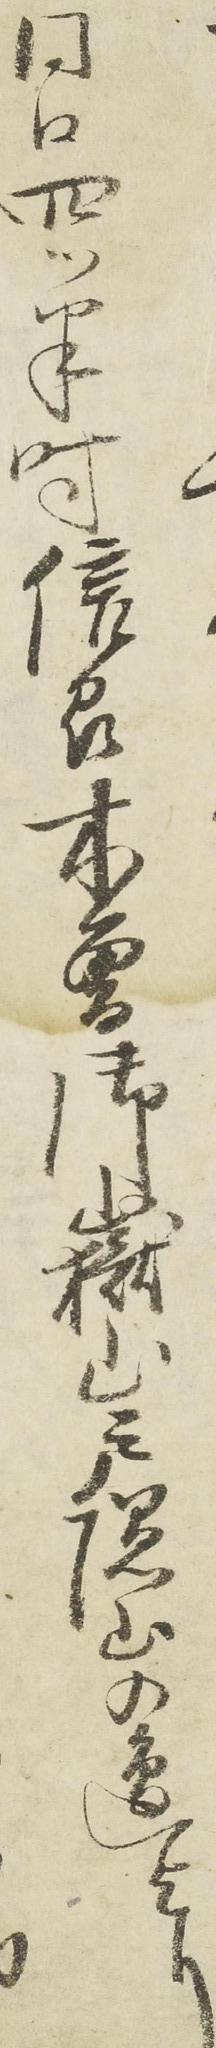同日四ツ半時信州木曽御嶽山戸隠山の辺より
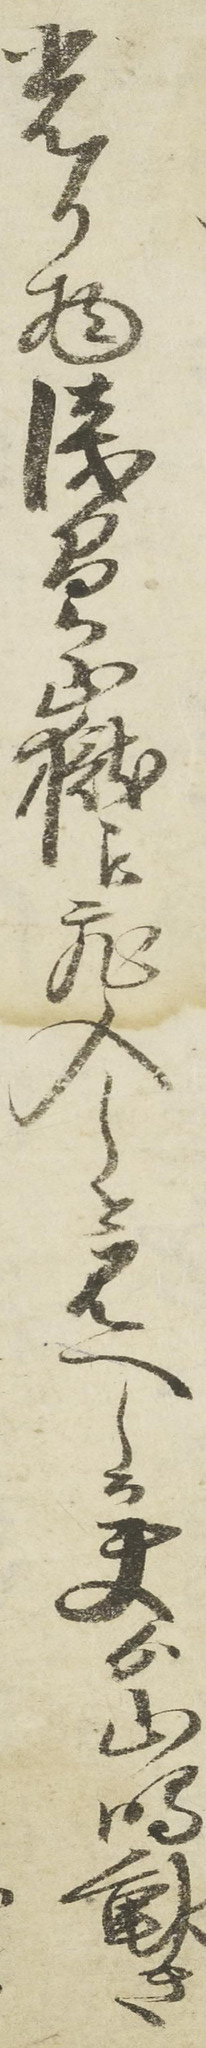光り物浅間山嶽え飛入しと見へしか夫ゟ山鳴動き
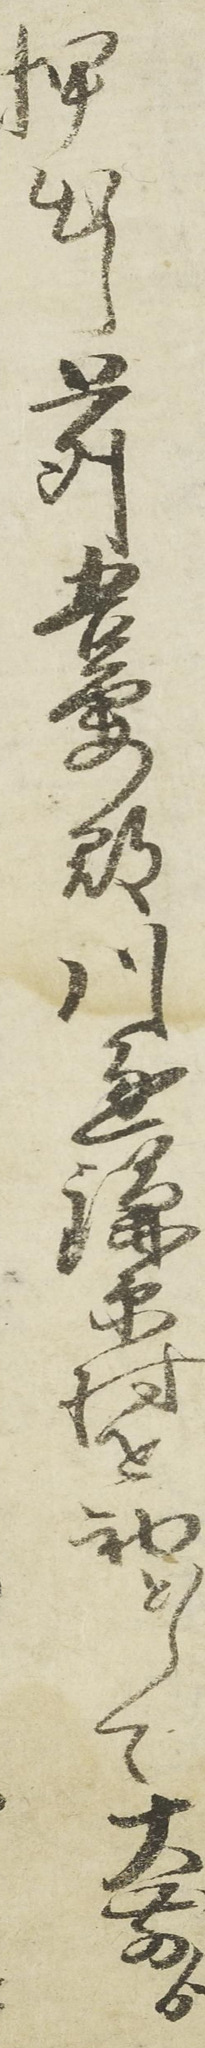押出し上州吾妻郡川通鎌原村を初として大前ゟ
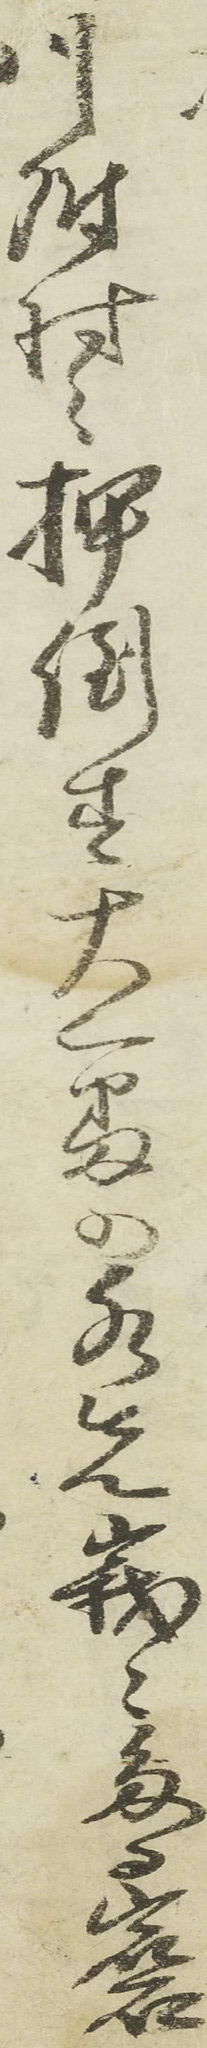川附村々押倒す大一番の水先峩々たる岩石
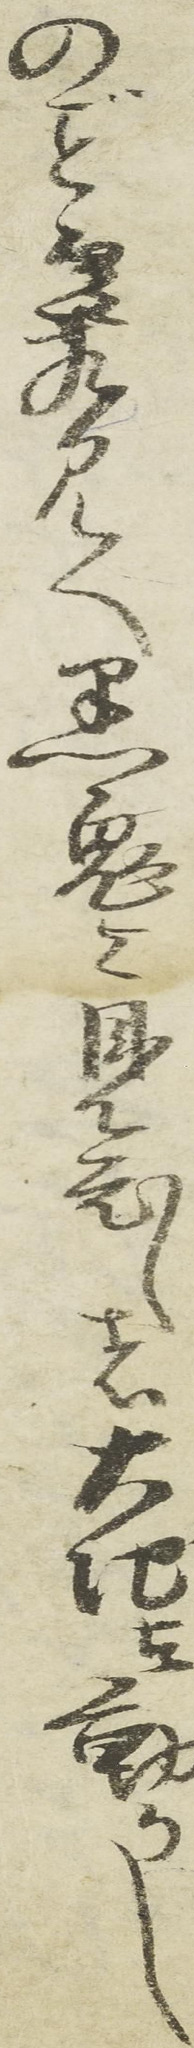のごとく相見へ黒鬼と見置し者大地え動かし
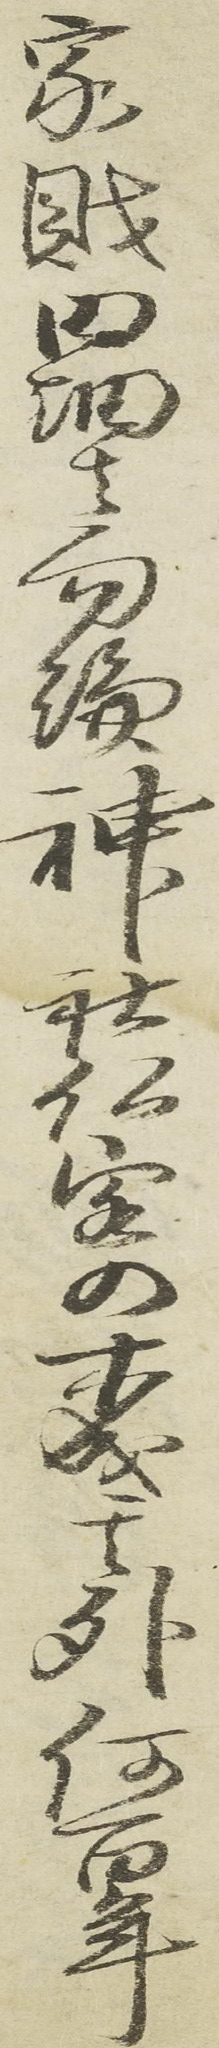家財田畑は勿論神社仏閣の森其外何百年
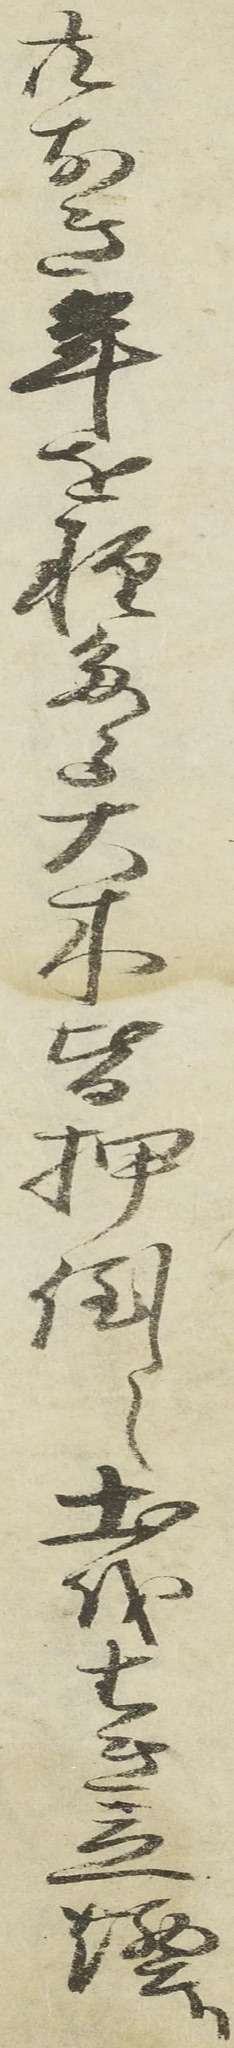共なき年を軽たる大木皆押倒し土をむき立煙り
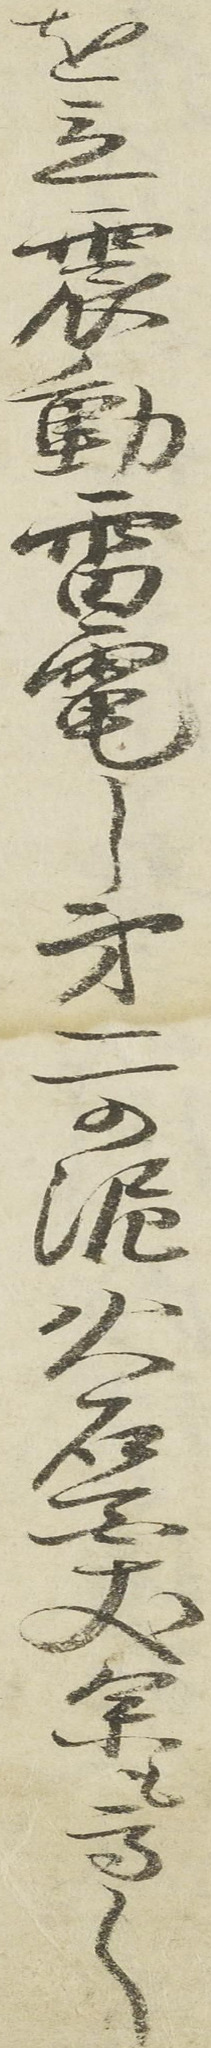を立震動雷電し第二の泥火石五丈余も高〳〵
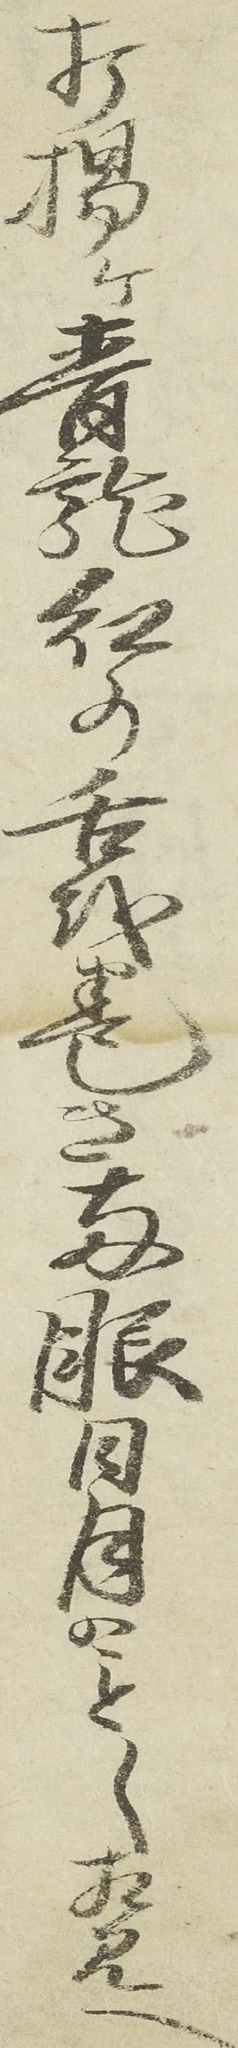打揚ケ青龍紅の舌を巻き両眼日月のことく相見へ
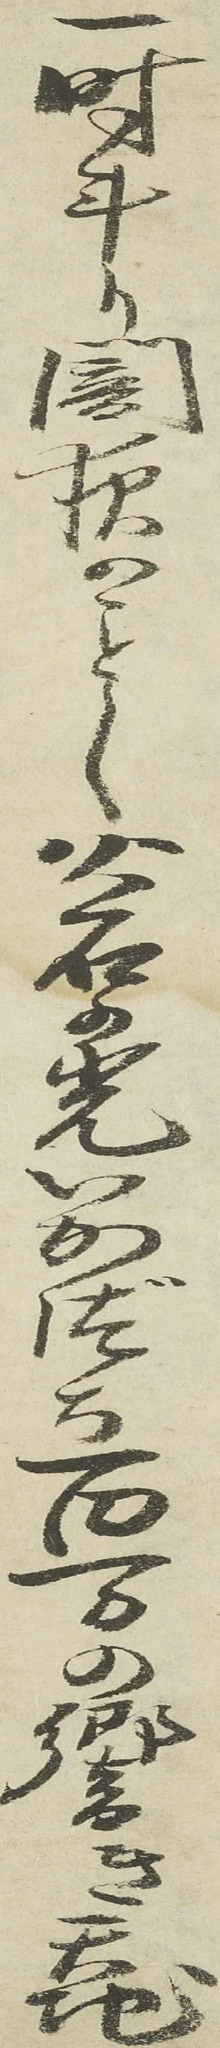一時斗り闇夜のことく火石の光いかずち百万の響き天地
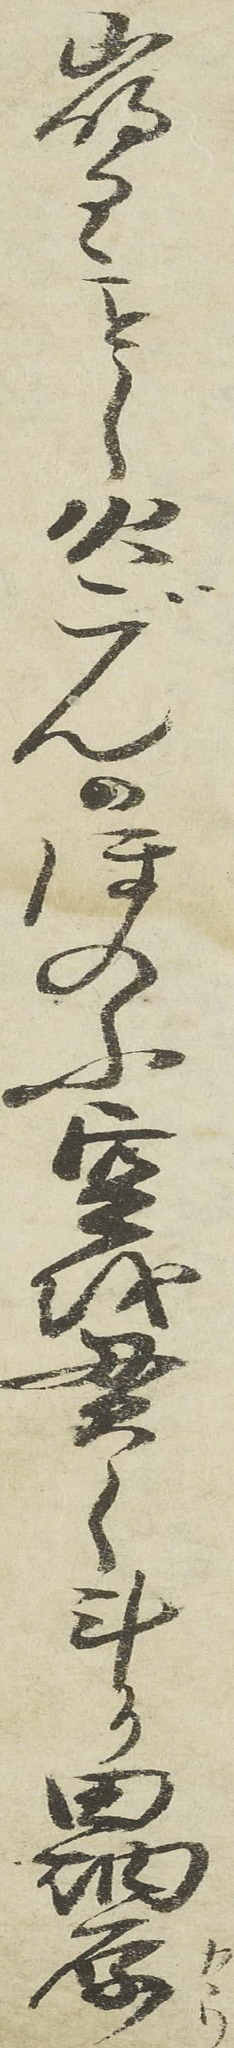崩るゝことく火ごんのほのふ空を貫く斗り田畑厚
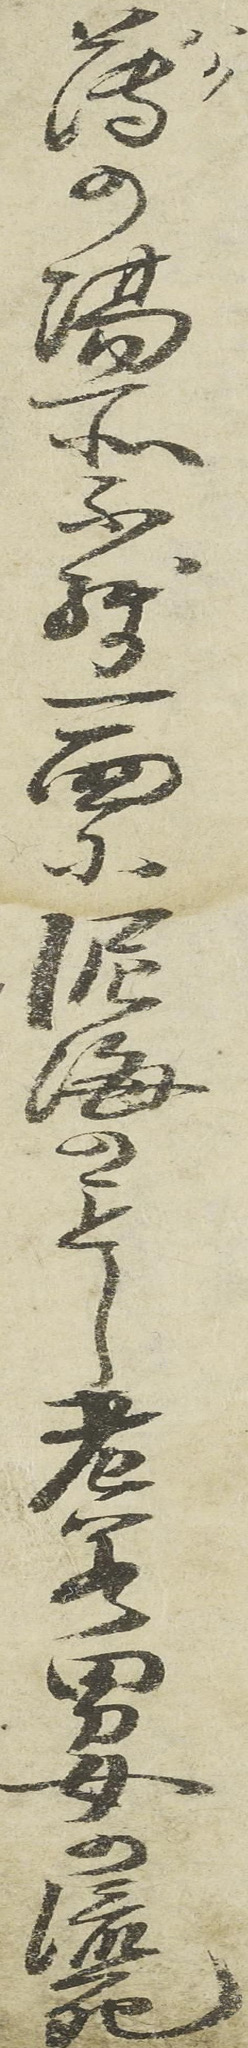薄の場所不残一面に泥海のことし老若男女の流死
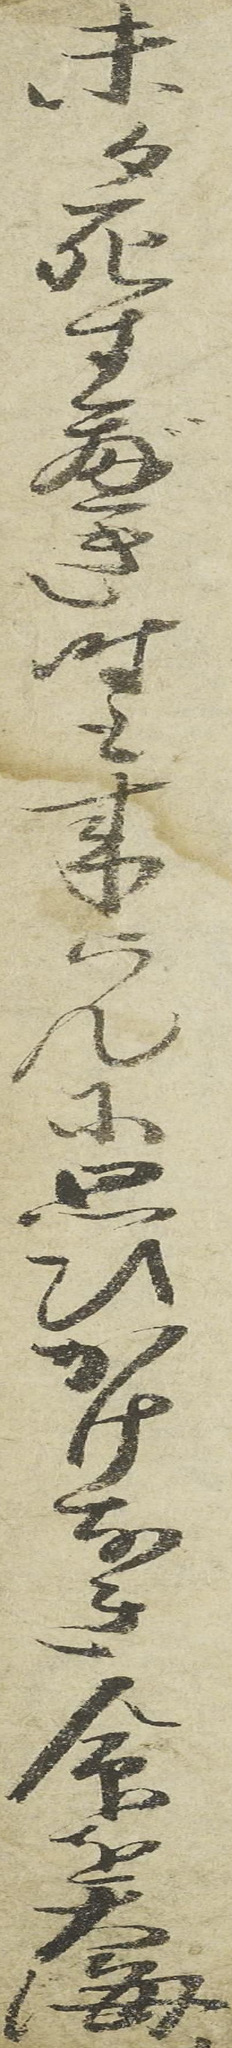未タ死すべき時も来らんに思ひかけなき命を大海ノ

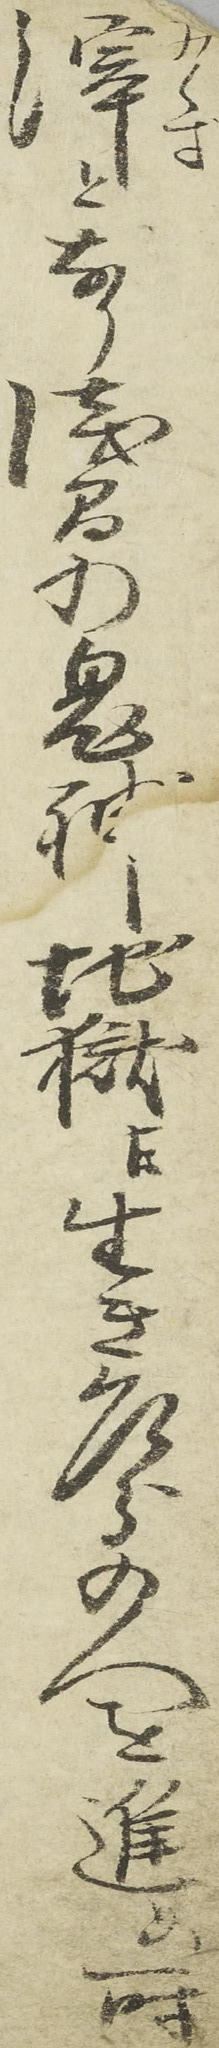滓となり浅間の鬼神地獄え生き乍らの人を進め一時
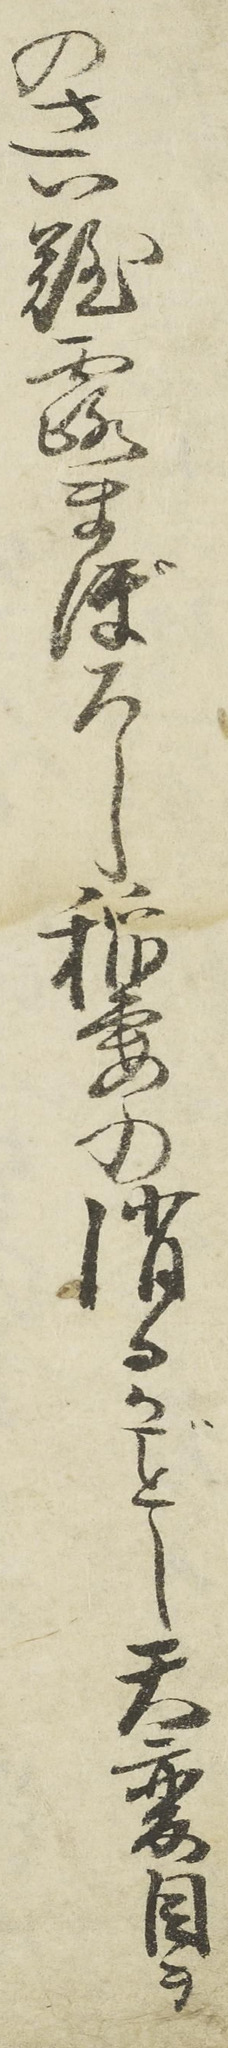のさい難露まぼろし稲妻の消るかごとし天変目ヲ
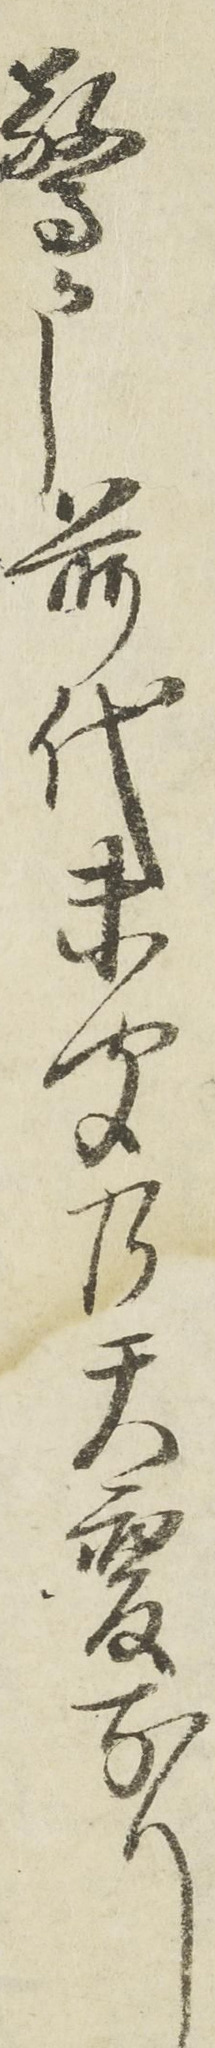驚かし前代未聞及天変なり
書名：浅間大変略記
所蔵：東京大学地震研究所図書室 Earthquake Research Institute Library, The University of Tokyo, JAPAN
